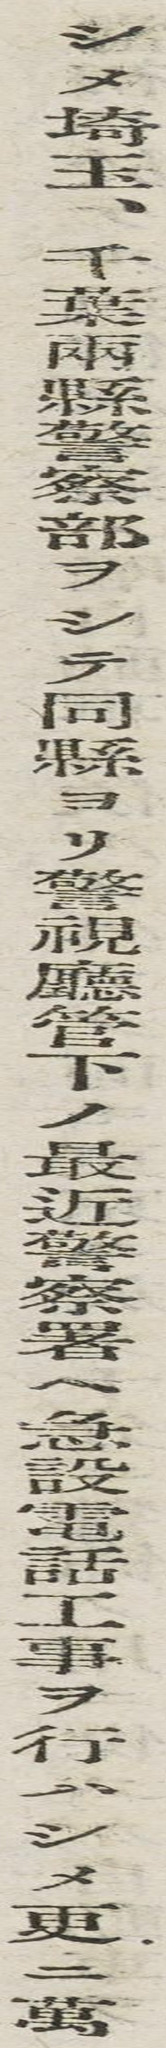シメ埼玉、千葉両県警察部ヲシテ同県ヨリ警視庁管下ノ最近警察署ヘ急設電話工事ヲ行ハシメ更ニ万
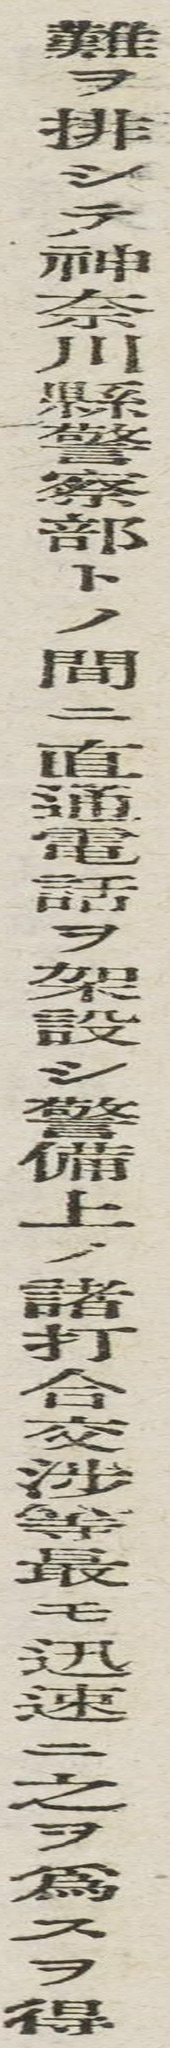難ヲ排シテ神奈川県警察部トノ間ニ直通電話ヲ架設シ警備上ノ諸打合交渉等最モ迅速ニ之ヲ為スヲ得

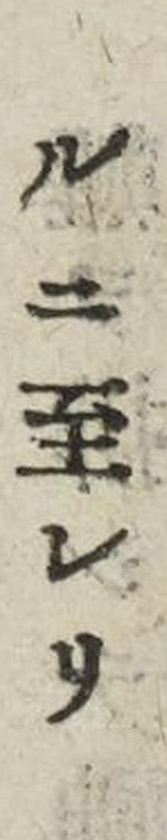ルニ至レリ
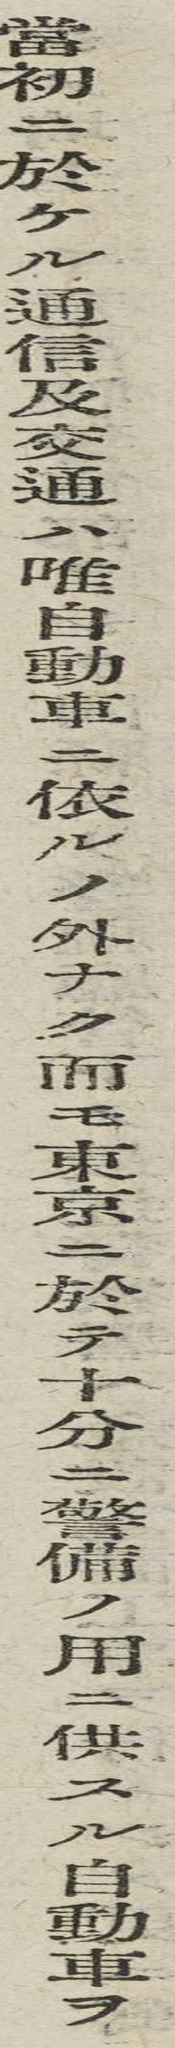当初ニ於ケル通信及交通ハ唯自動車ニ依ルノ外ナク而モ東京ニ於テ十分ニ警備ノ用ニ供スル自動車ヲ
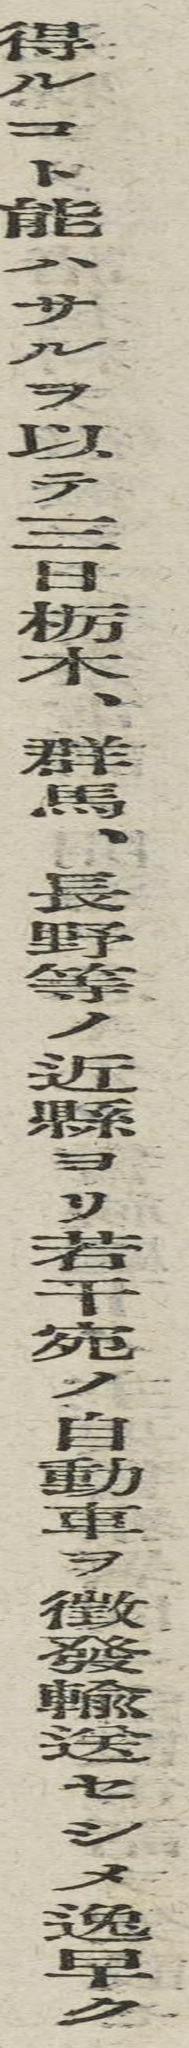得ルコト能ハサルヲ以テ三日栃木、群馬、長野等ノ近県ヨリ若干宛ノ自動車ヲ徴発輸送セシメ逸早ク
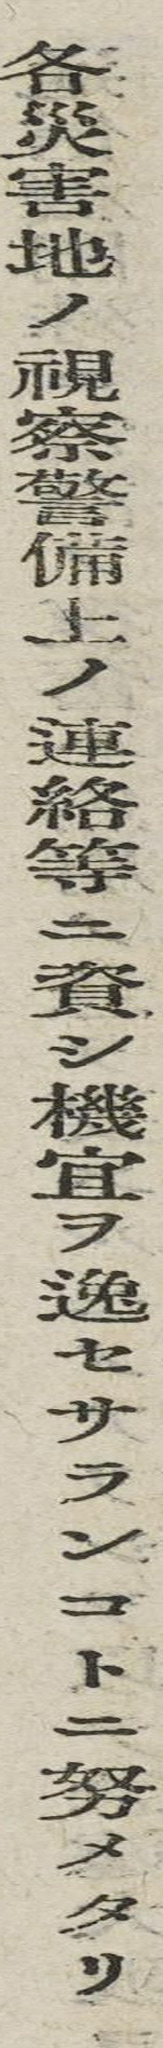各災害地ノ視察警備上ノ連絡等ニ資シ機宜ヲ逸セサランコトニ努メタリ
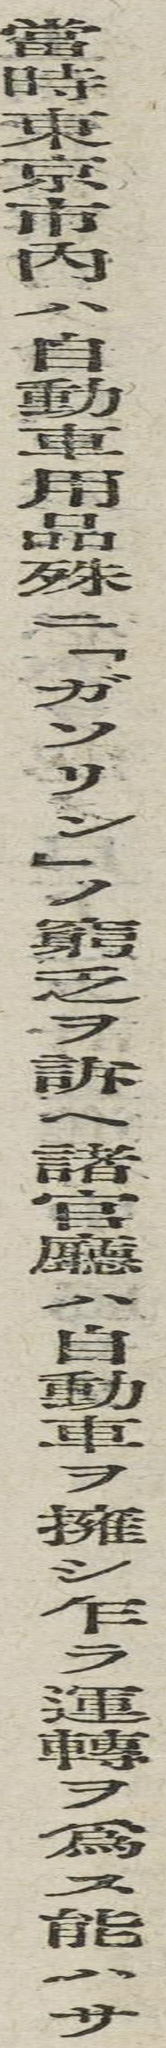当時東京市内ハ自動車用品殊ニ「ガソリン」ノ窮乏ヲ訴ヘ諸官庁ハ自動車ヲ擁シ乍ラ運転ヲ為ス能ハサ
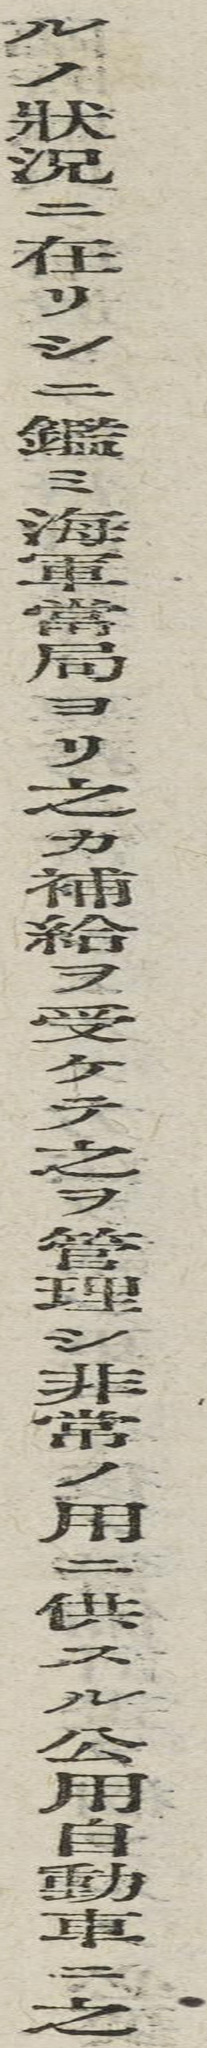ルノ状況ニ在リシニ鑑ミ海軍当局ヨリ之カ補給ヲ受ケテ之ヲ管理シ非常ノ用ニ供スル公用自動車ニ之
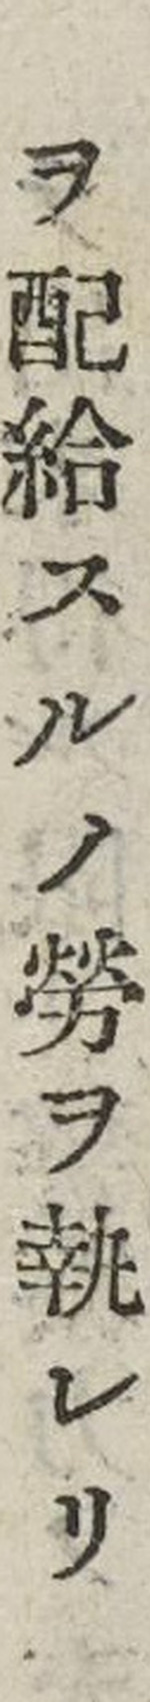ヲ配給スルノ労ヲ執レリ
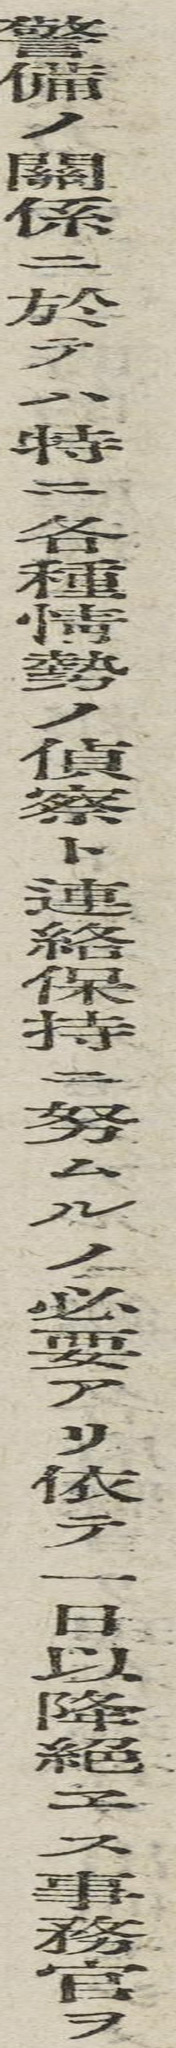警備ノ関係ニ於テハ特ニ各種情勢ノ偵察ト連絡保持ニ努ムルノ必要アリ依テ一日以降絶エス事務官ヲ
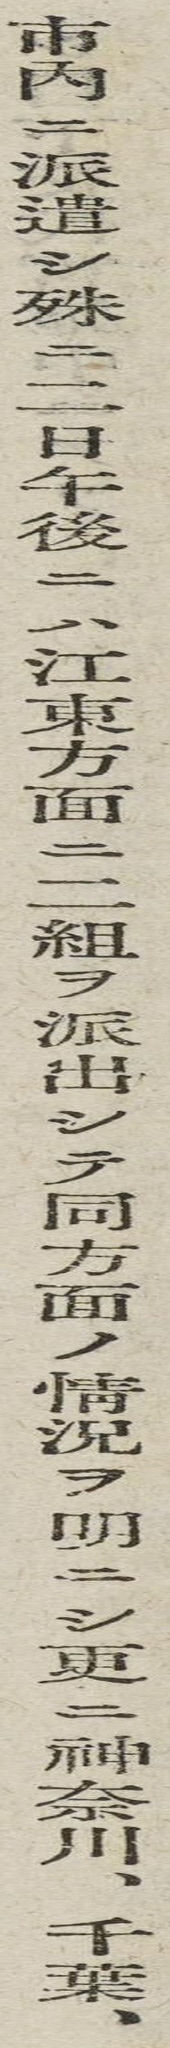市内ニ派遣シ殊ニ二日午後ニハ江東方面ニ二組ヲ派出シテ同方面ノ情況ヲ明ニシ更ニ神奈川、千葉、
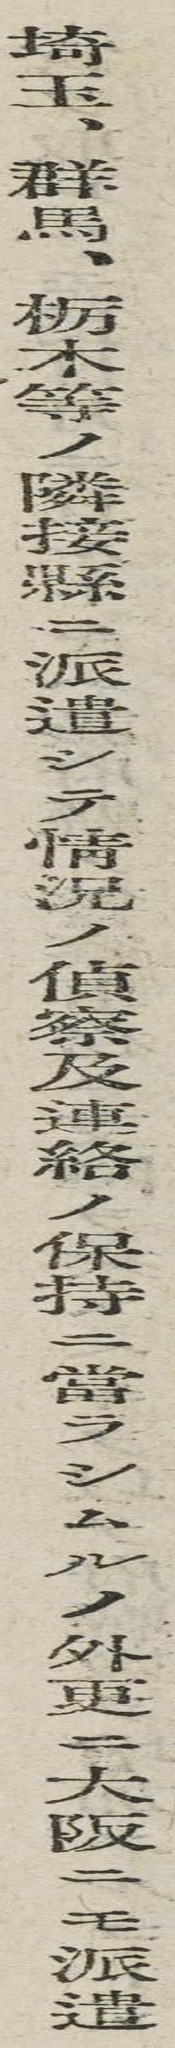埼玉、群馬、栃木等ノ隣接県ニ派遣シテ情況ノ偵察及連絡ノ保持ニ当ラシムルノ外更ニ大阪ニモ派遣
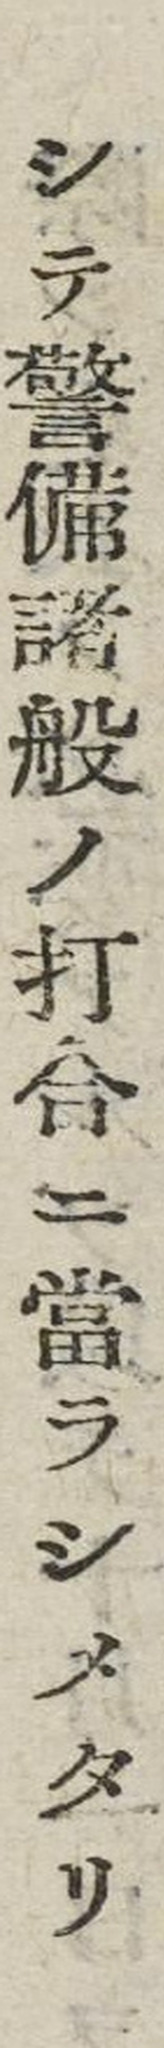シテ警備諸般ノ打合ニ当ラシメタリ
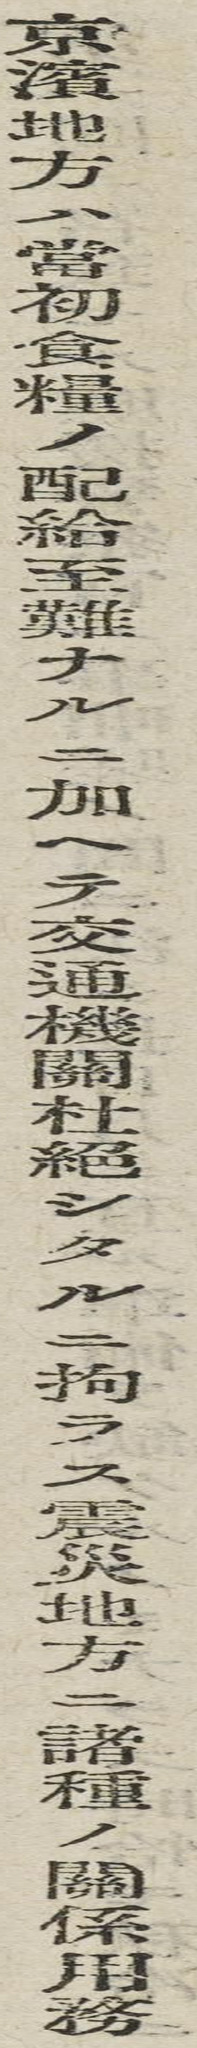京浜地方ハ当初食糧ノ配給至難ナルニ加ヘテ交通機関杜絶シタルニ拘ラス震災地方ニ諸種ノ関係用務
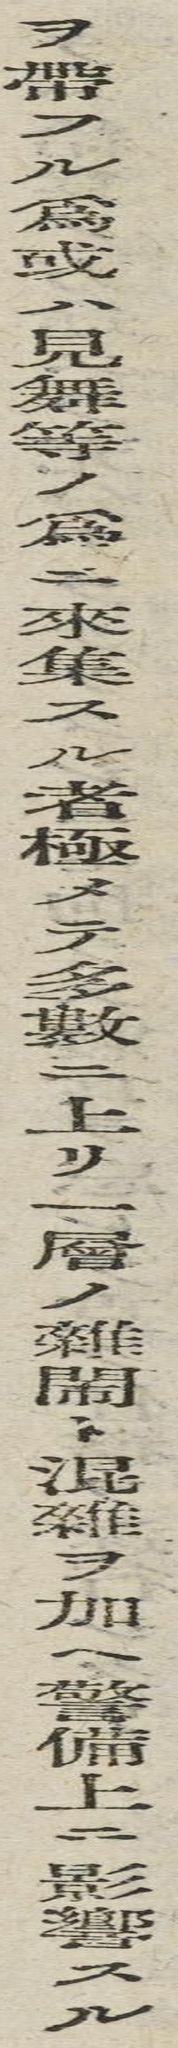ヲ帯フル為或ハ見舞等ノ為ニ来集スル者極メテ多数ニ上リ一層ノ雑踏・混雑ヲ加ヘ警備上ニ影響スル
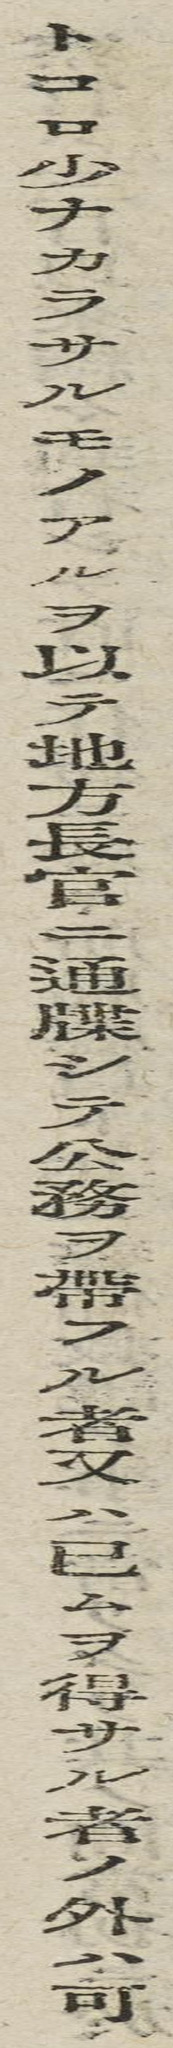トコロ少ナカラサルモノアルヲ以テ地方長官ニ通牒シテ公務ヲ帯フル者又ハ已ムヲ得サル者ノ外ハ可
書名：震災被害状況並救護施設概要
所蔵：東京大学地震研究所図書室 Earthquake Research Institute Library, The University of Tokyo, JAPAN
